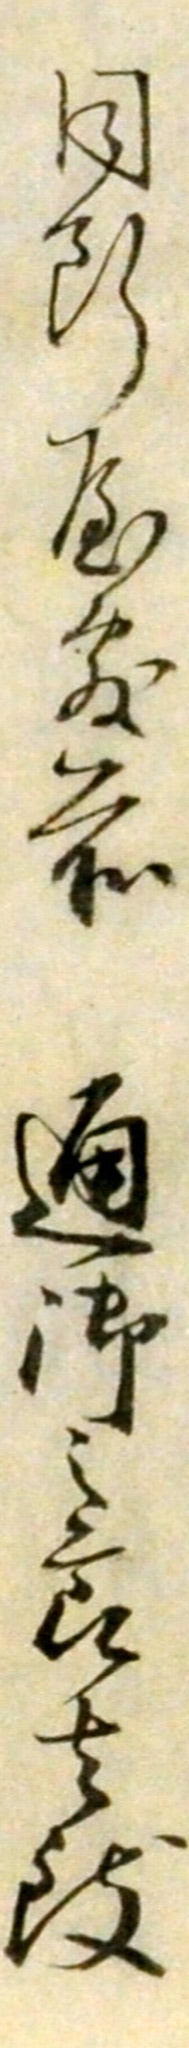同断屋敷前通御之節は致
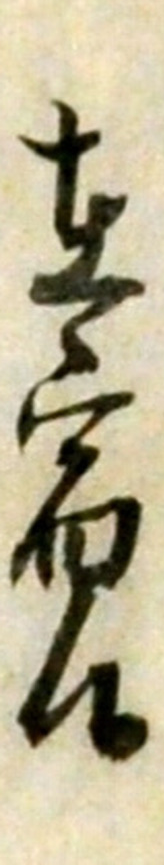在宿候
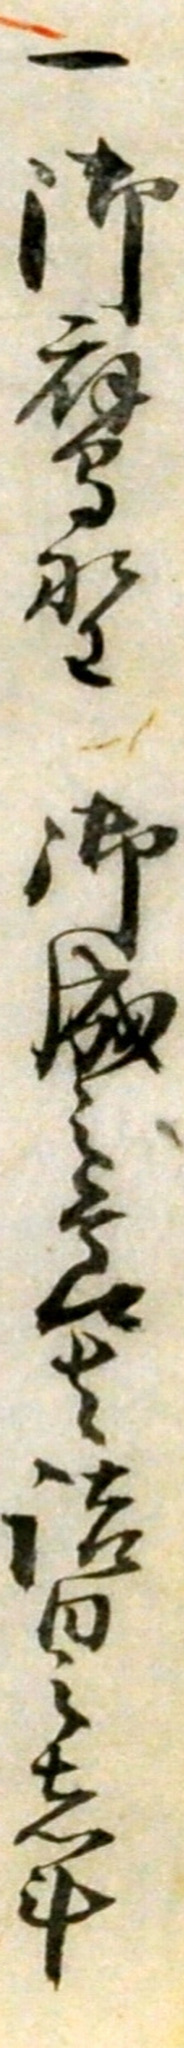一御鷹野御成之節は詰日之者斗
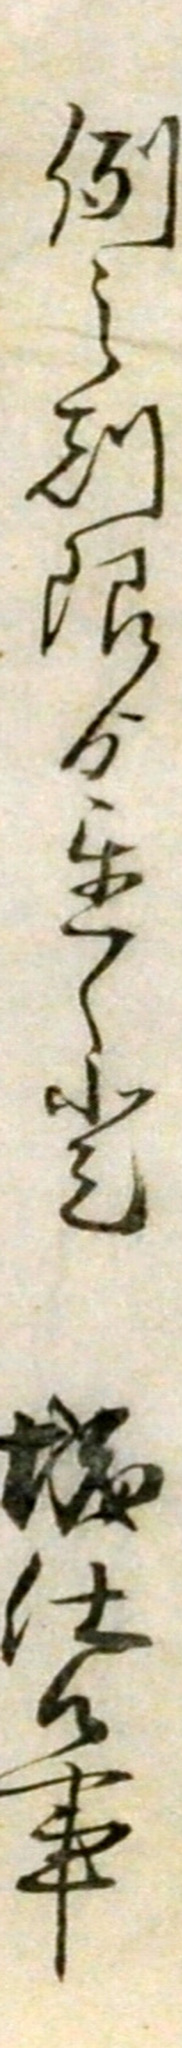例之刻限ゟ遅く登城仕候事
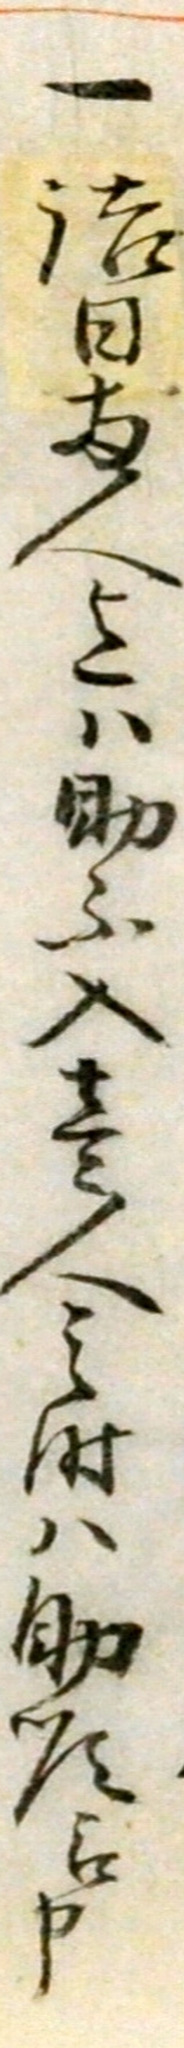一詰日両人迄は助不入壱人之時は助順え申
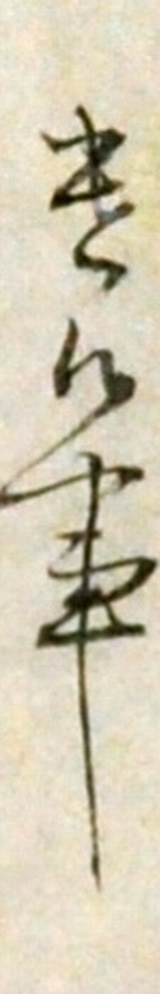遣候事

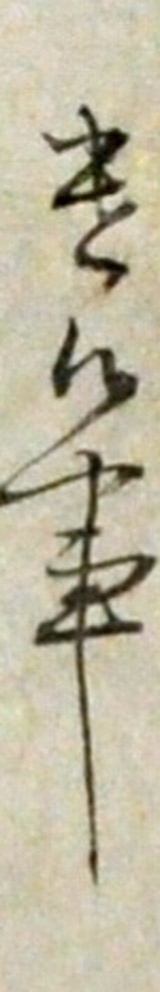城候事
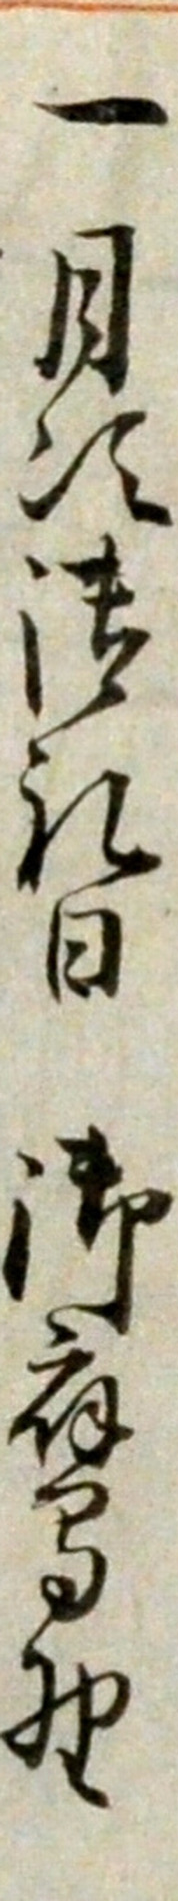一月次御礼日御鷹野
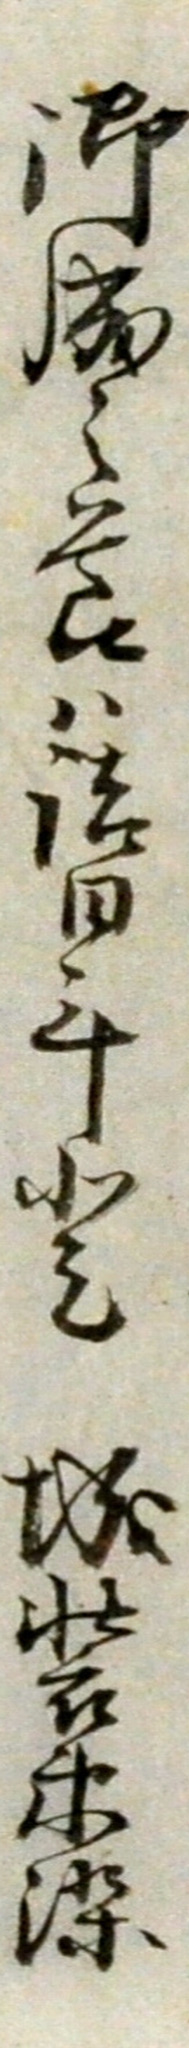御成之節詰日斗登城装束染
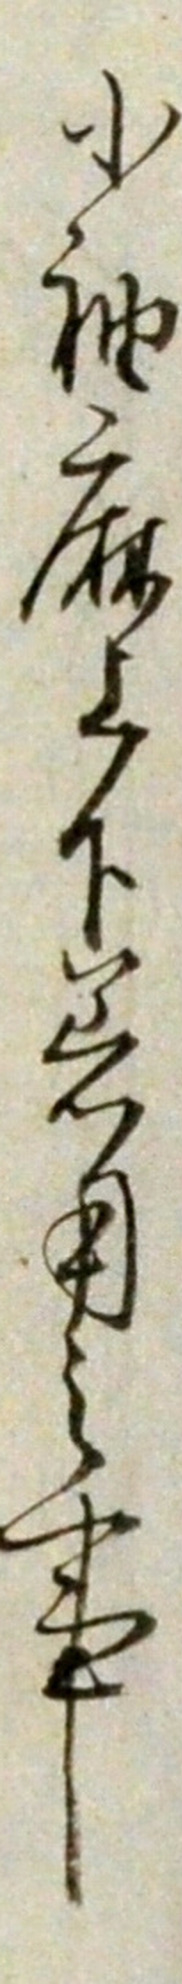小袖麻上下着用之事
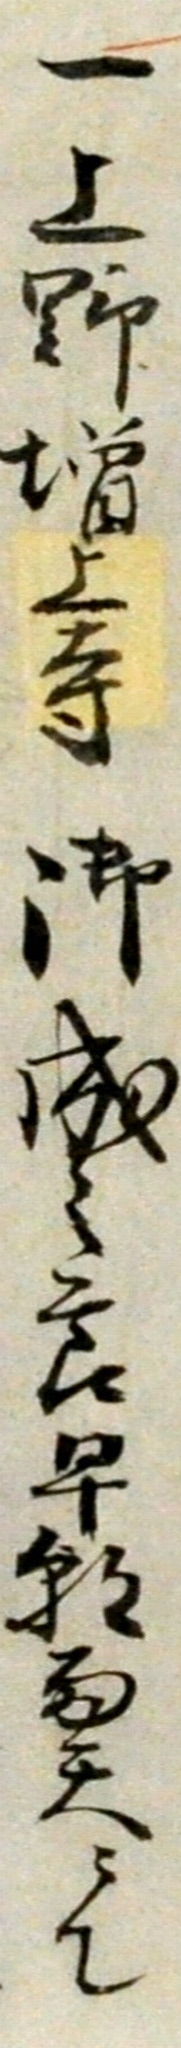一上野増上寺御成之節早朝雨天にて
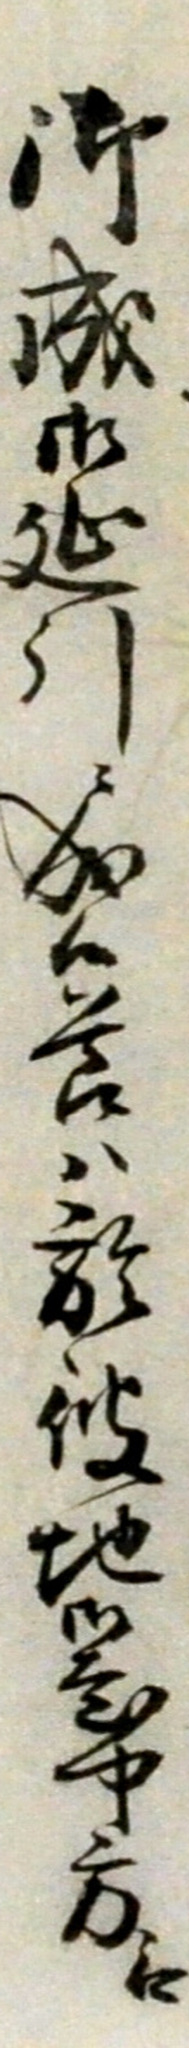御成御延引に成候節は於彼地御老中方え
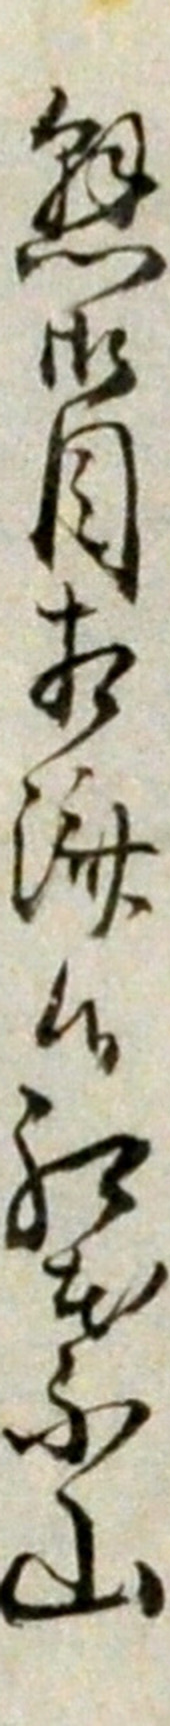懸御目相済候紅葉山
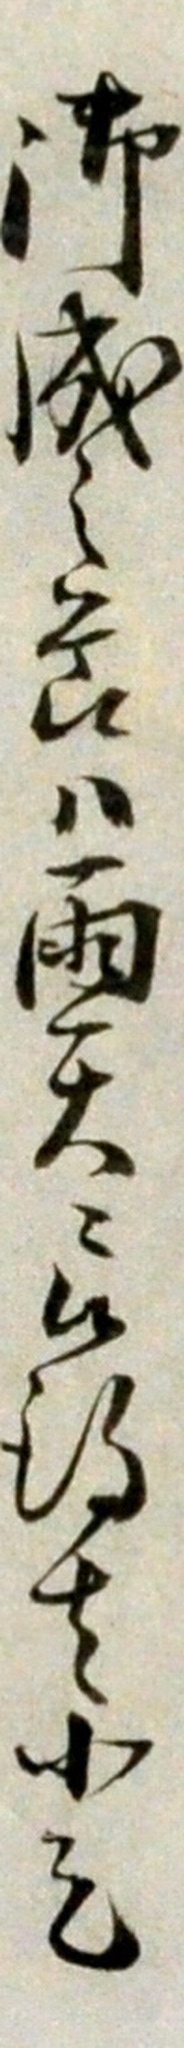御成之節は雨天に候得は登
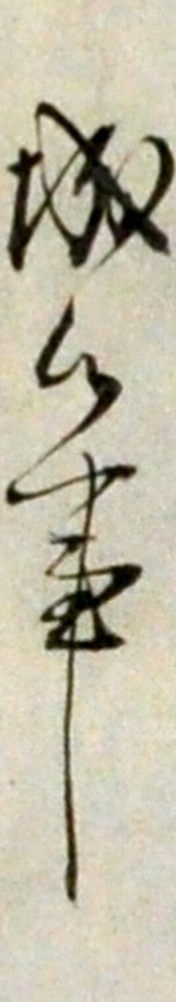城候事
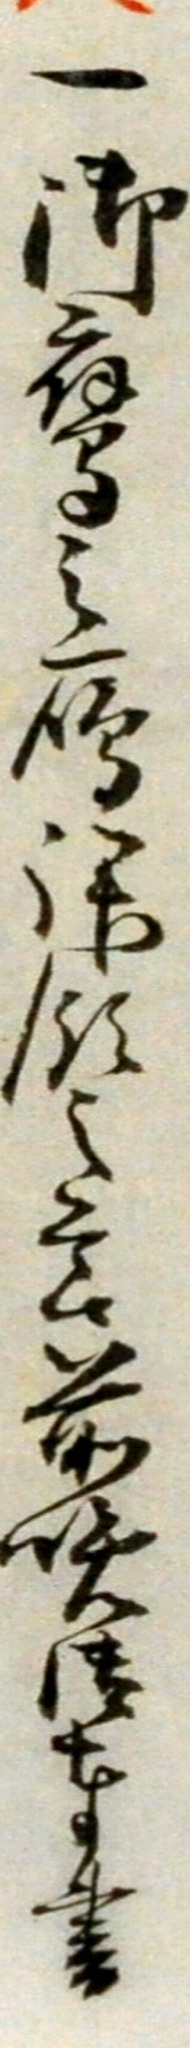一御鷹之雁拝領之節前晩御奉書
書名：申合帳〔一括〕
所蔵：伊那市立高遠町図書館・合同会社AMANE
